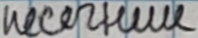песочник
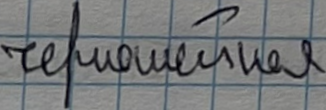черношейная
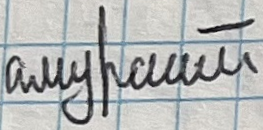амурский
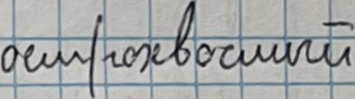острохвостый
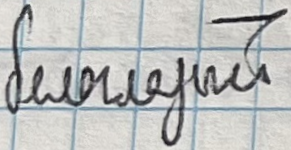белоглазый
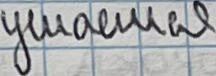ушастая
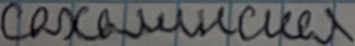сахалинская
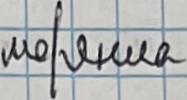морянка
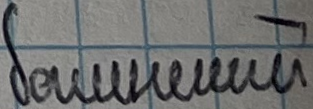бонинский
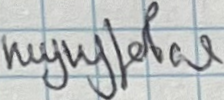тундровая
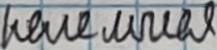пепельная
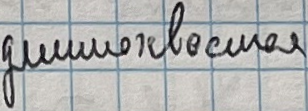длиннохвостая
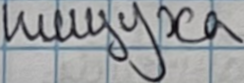пищуха
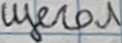щегол
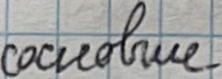сосновик
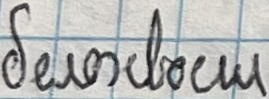белохвост
